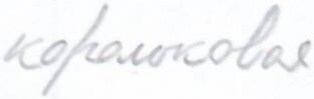корольковая
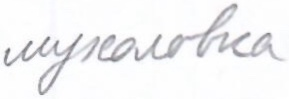мухоловка
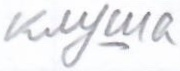клуша
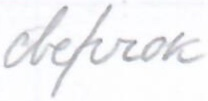сверчок
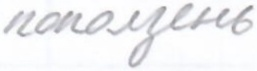поползень
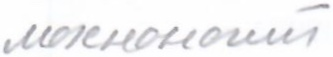мохноногий
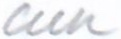сип
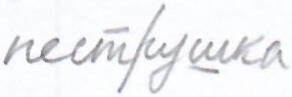пеструшка
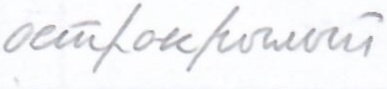острокрылый
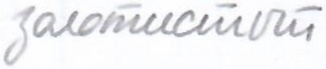золотистый
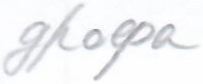дрофа
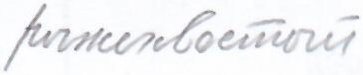рыжехвостый
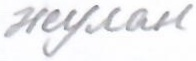жулан
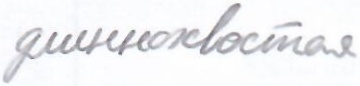длиннохвостая
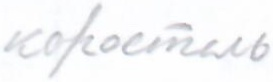коростель
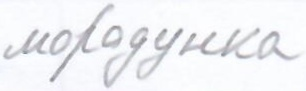мородунка
